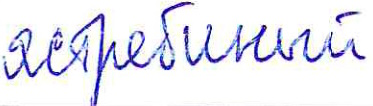ястребиный
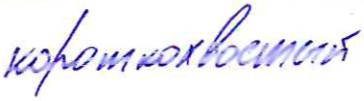короткохвостый
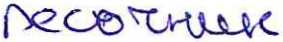песочник
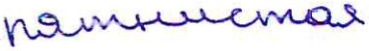пятнистая
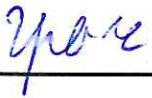грач
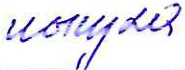лысуха
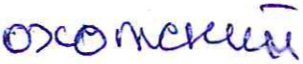охотский
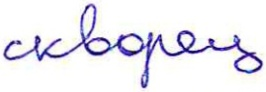скворец
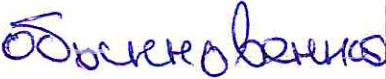обыкновенноя
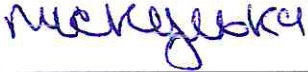пискулька
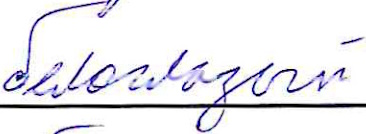белоглазый
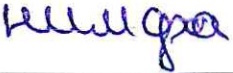нимфа
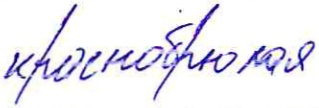кроснобрюхая
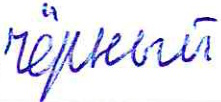чёрный
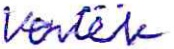колёк
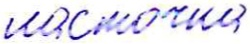ласточка
